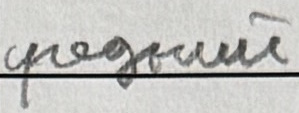средний
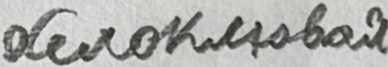белоклювая
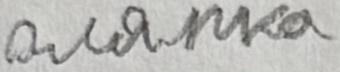оляпка
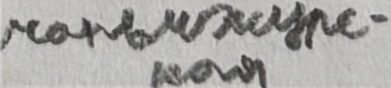маньчжурс-кая
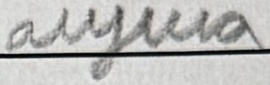олуша
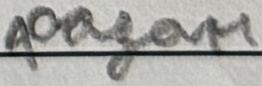фазан
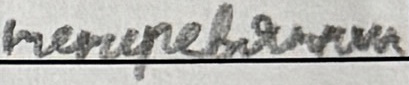тетеревятник
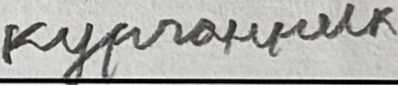курганник
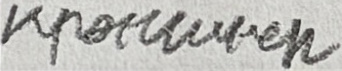кроншнеп
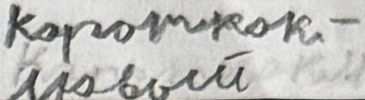короткок-лювый
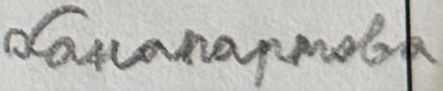бонапартова
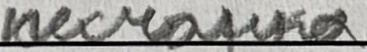песчанка
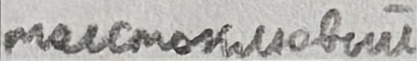толстоклювый
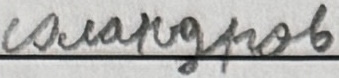соландров
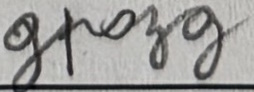дрозд
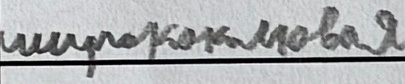ширококлювая
